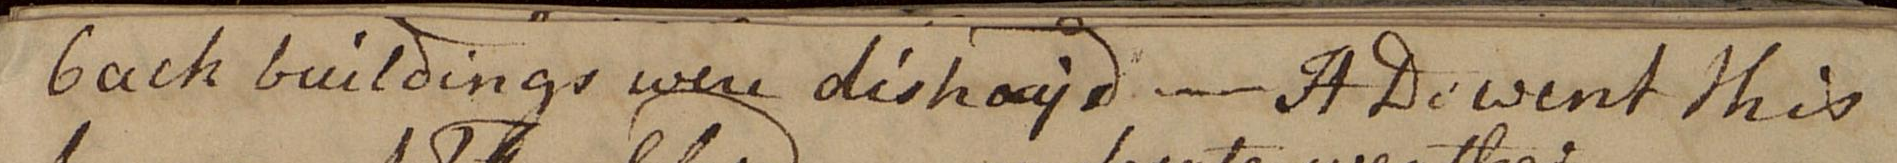back buildings were distroy'd- H D. went this
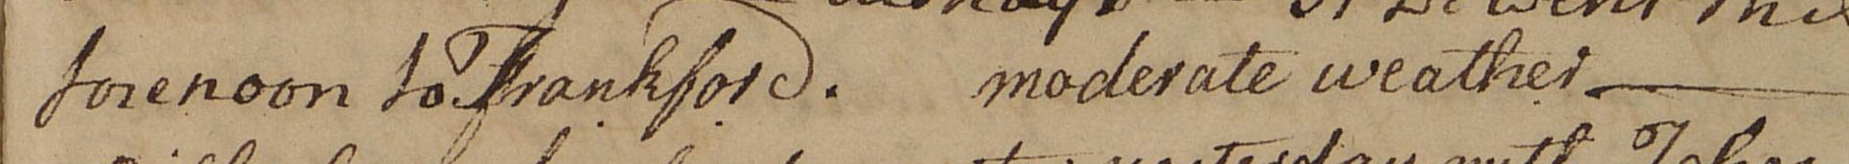forenoon to Frankford. moderate weather-
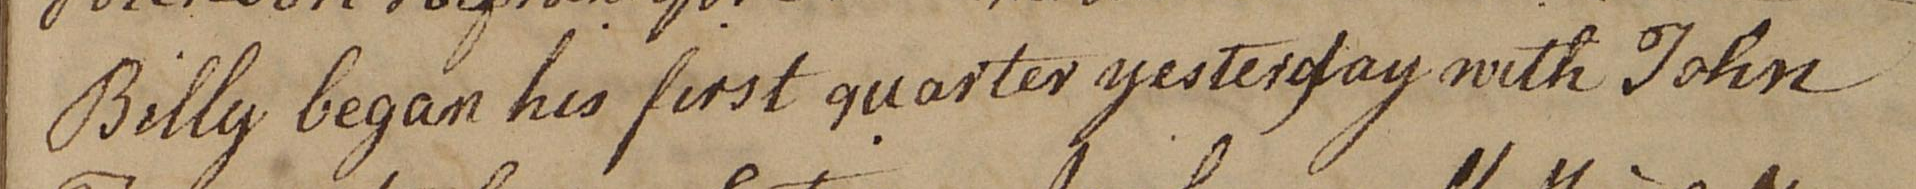Billy began his first quarter yesterday with John
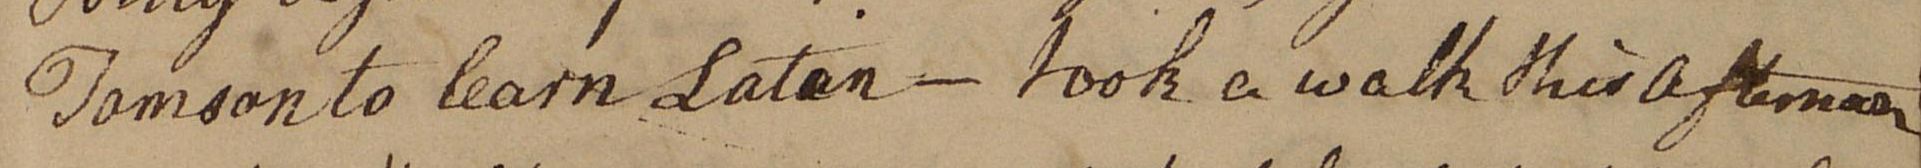Tomson to learn Latin- took a walk this Afternoon
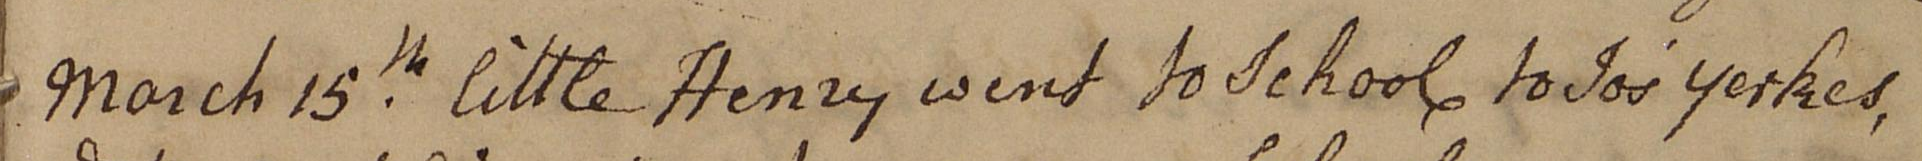March 15^th. little Henry went to School to Jos' Yorkes,
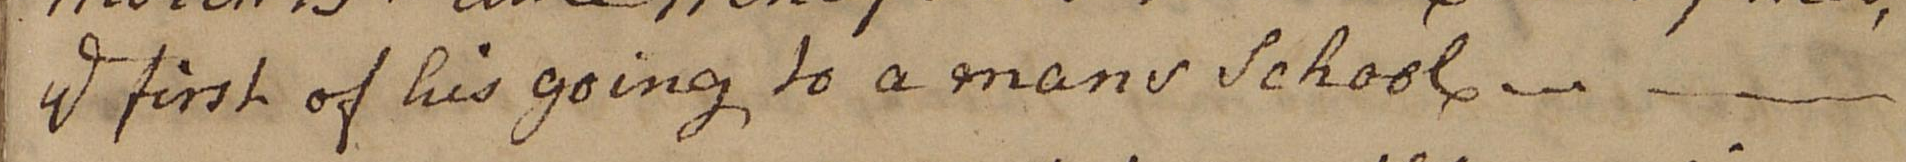y^e first of his going to a mans School-
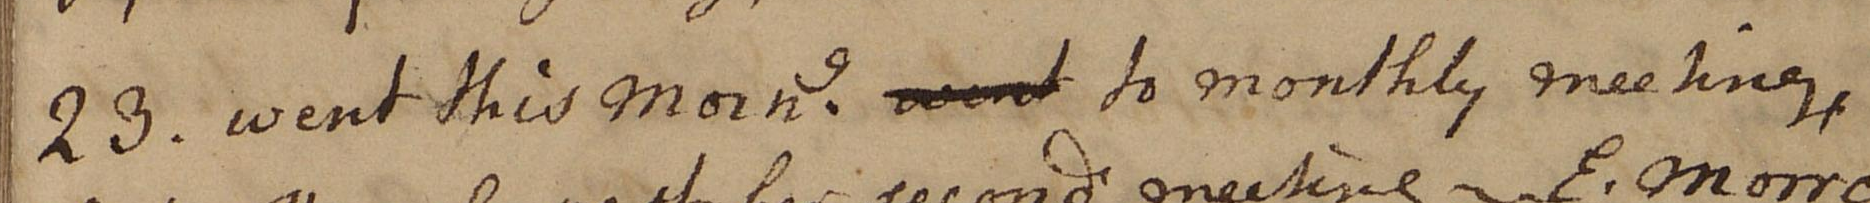23. went this morn^g. [went] to monthly meeting,
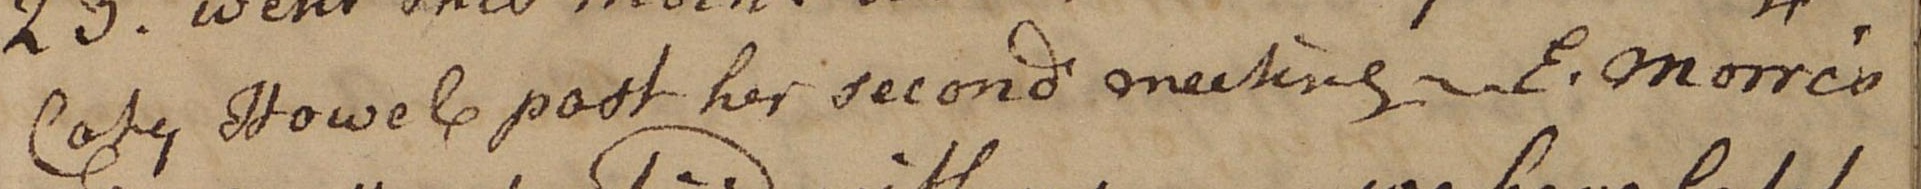Caty Howel past her second meeting- E. Morris
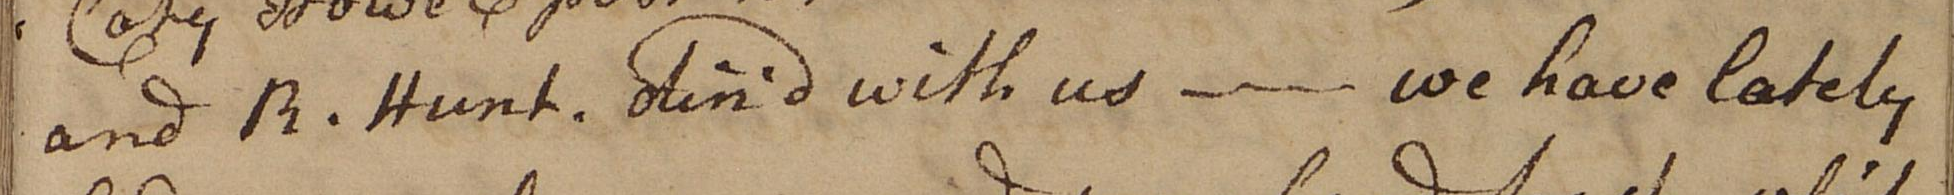and R. Hunt. din'd with us- we have lately
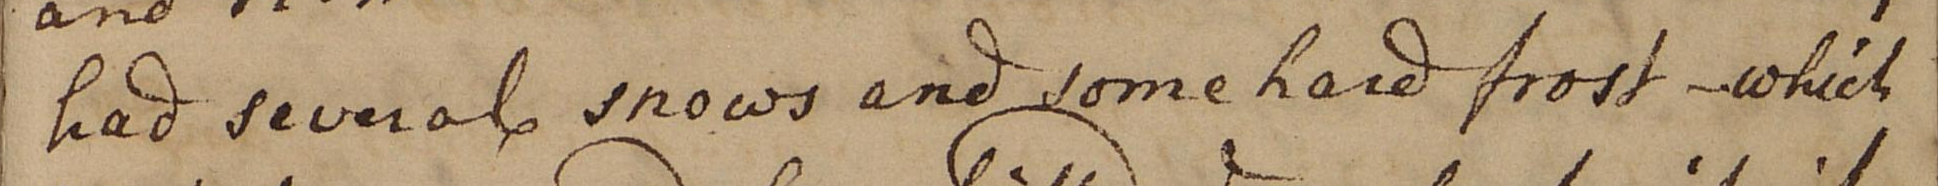had several snows and some hard frost- which
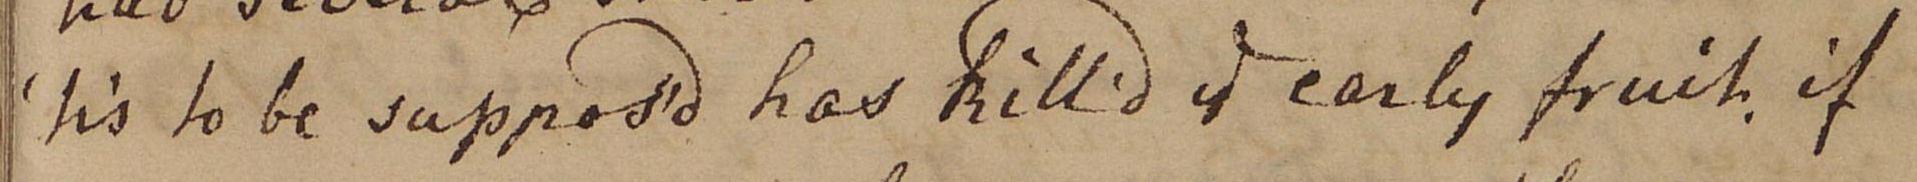'tis to be suppos'd has kill'd y^e early fruit, if
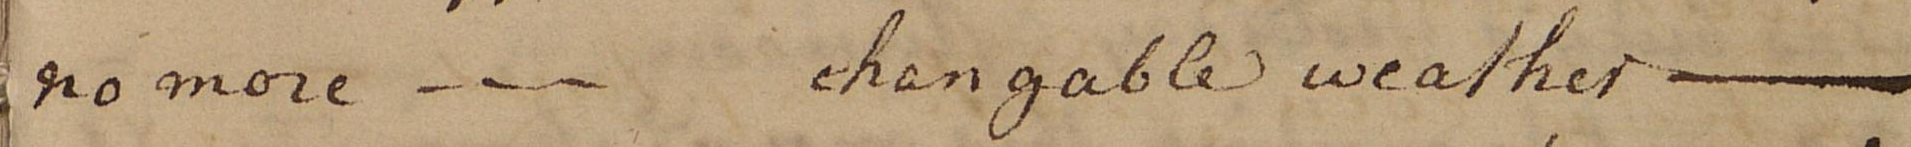no more-- changable weather-
